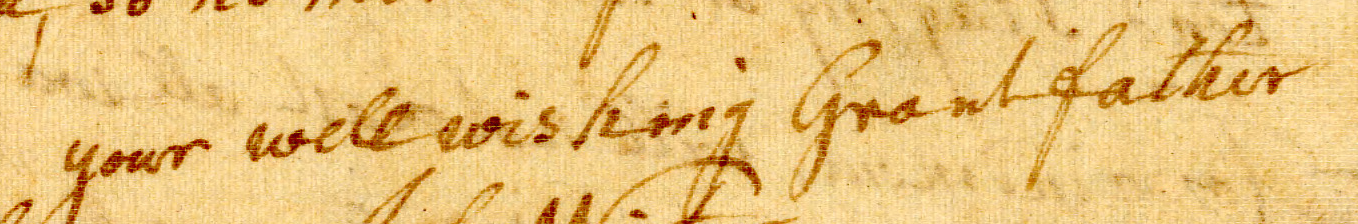your well wishing Grantfather
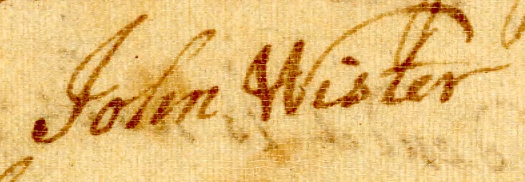John Wister
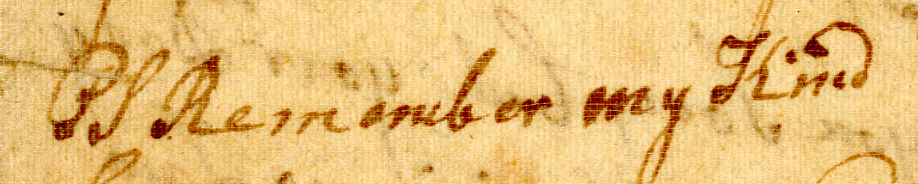Pl Remmber my Kind
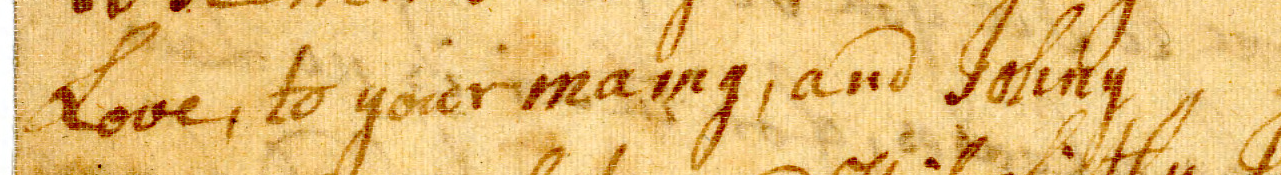Love, to your mamy, and Johny
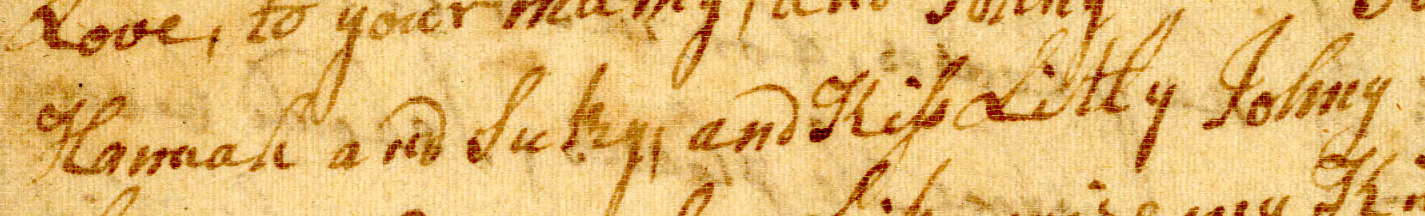Hannah and Suky, and Kiss Littly Johny
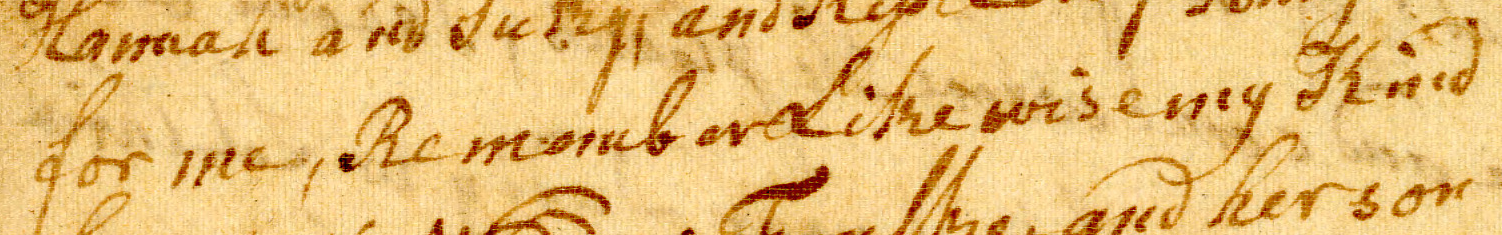for me, Remember Likewise my Kind
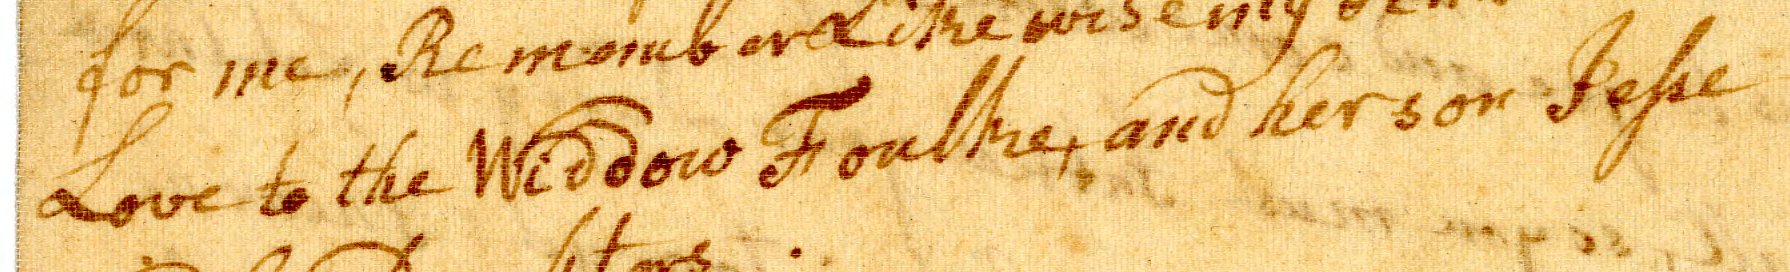Love to the Widow Foulke, and her son Jesse
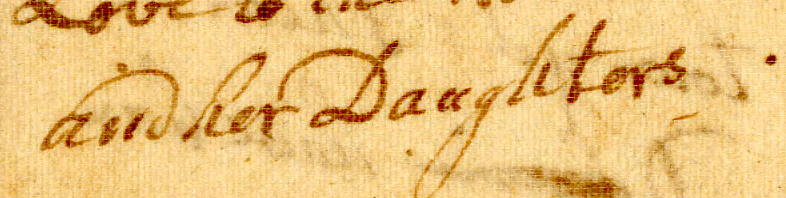and her Daughters
